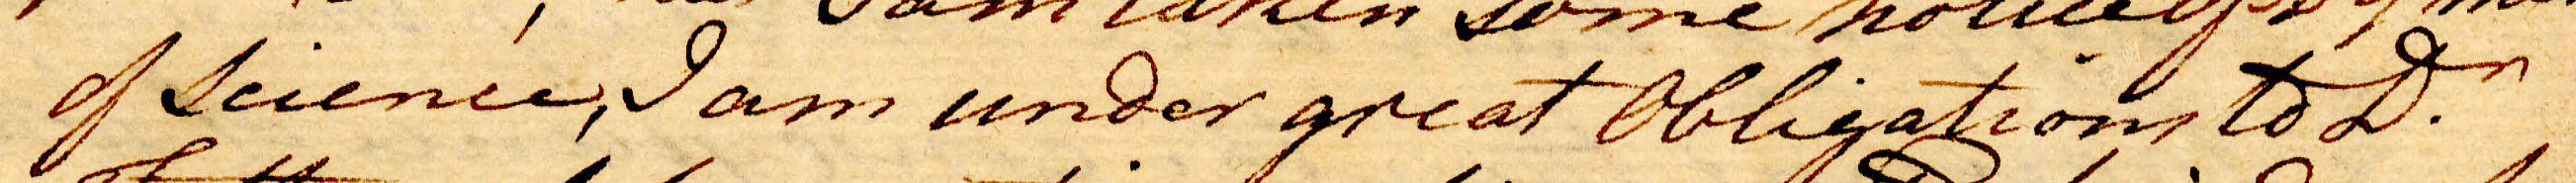of Science, I am under great Obligations to D^r.
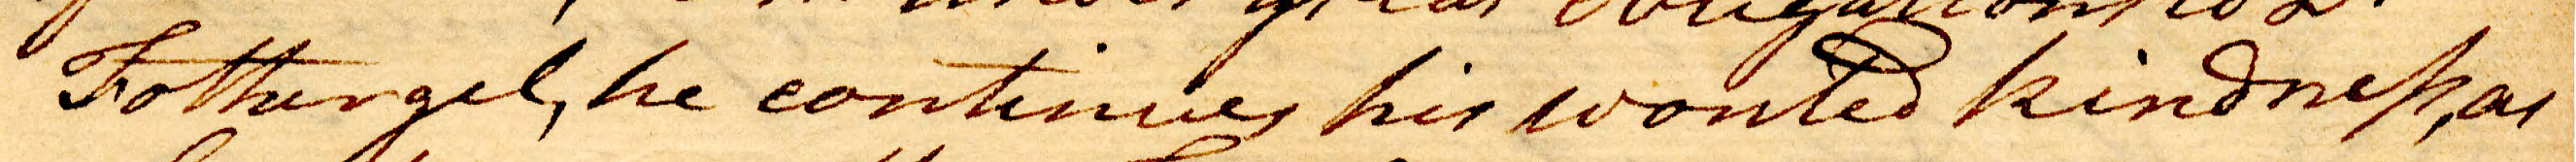Fothergel, he continues his wonted kindness, as
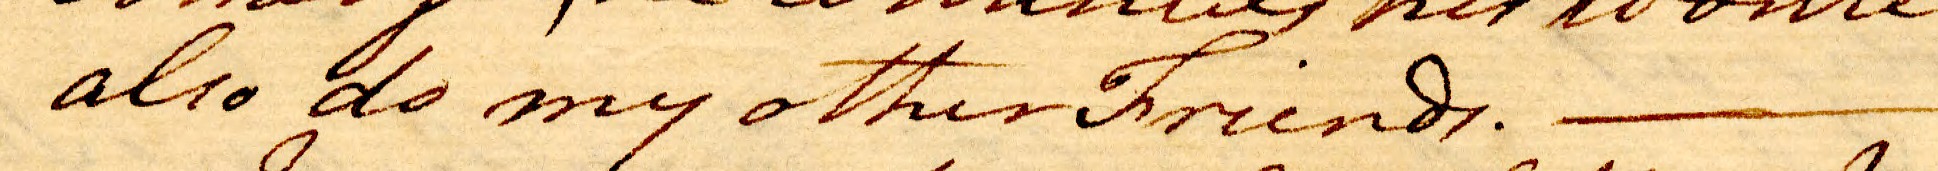also do my other Friends.-
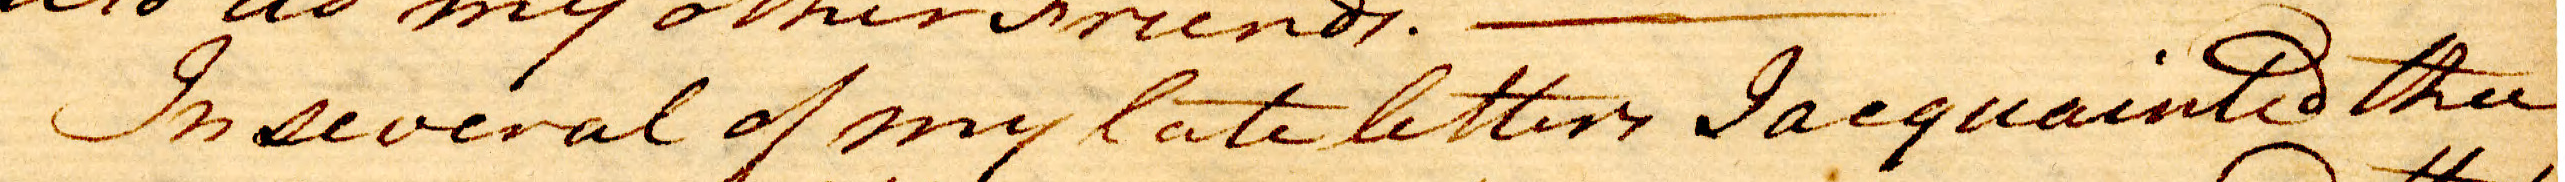In several of my late letters I acquainted thee
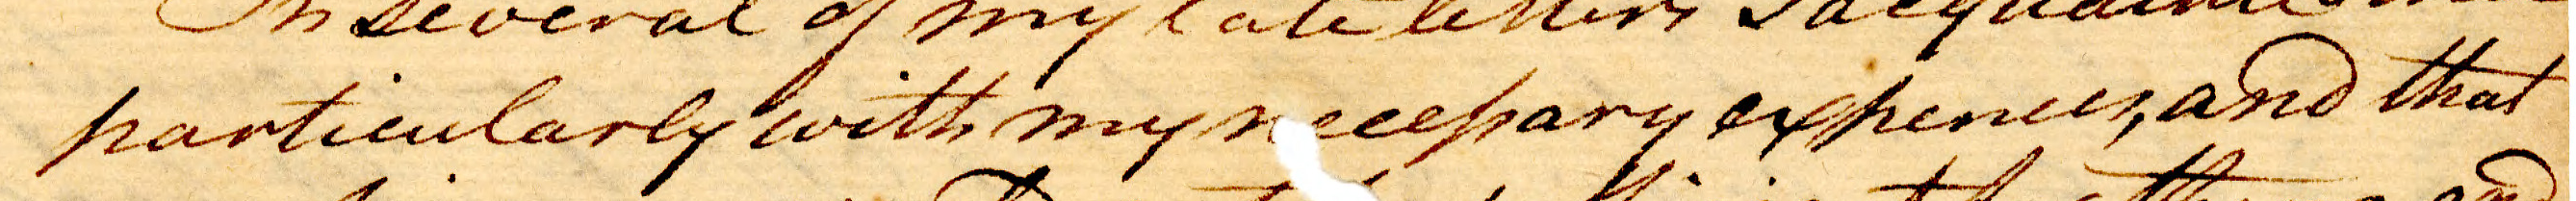particularly with my necessary expences, and that
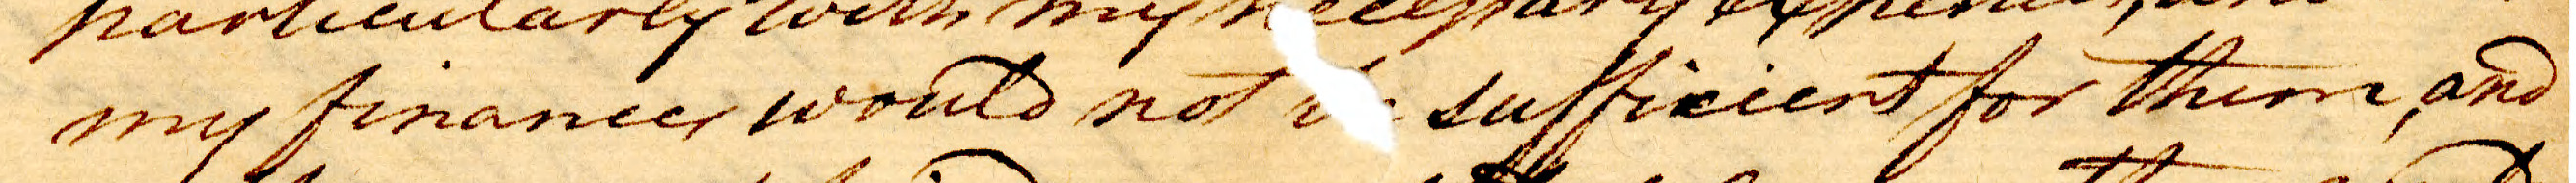my finances would not be sufficient for them, and
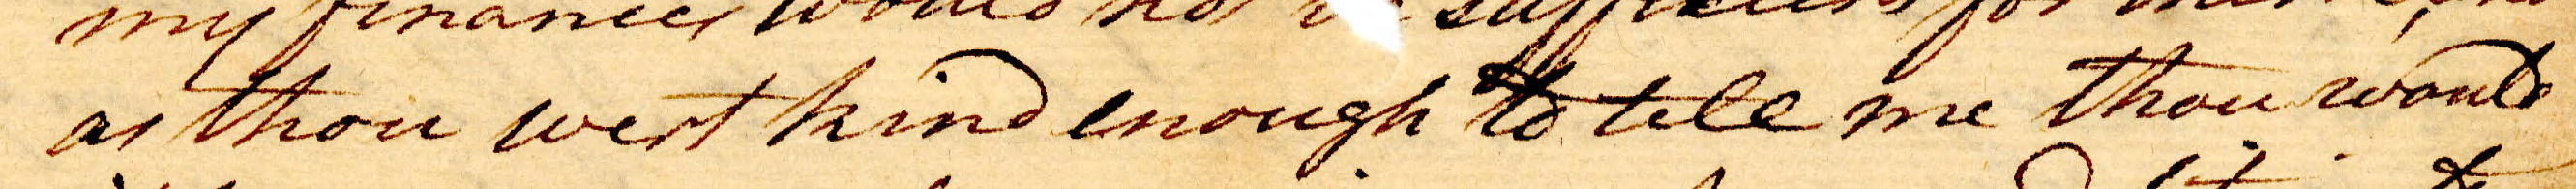as thou wert kind enough to tell me thou would
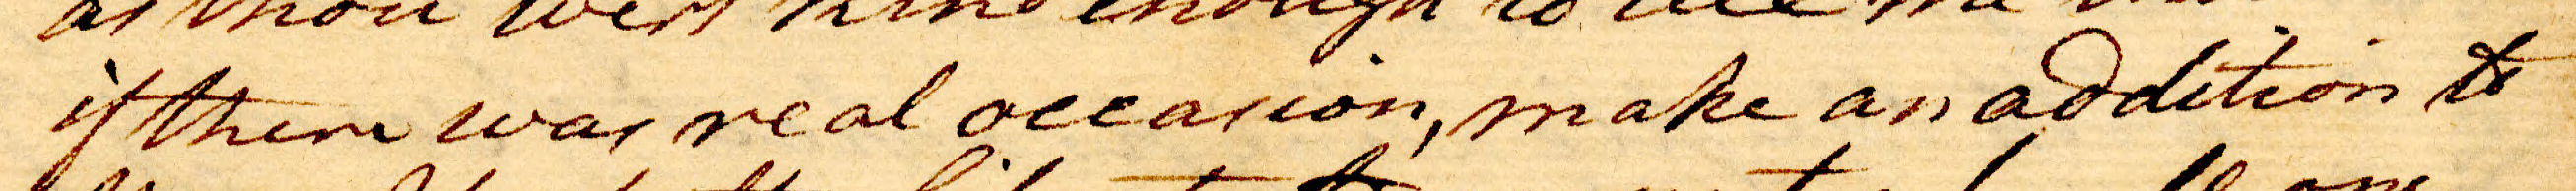if there was real occasion, make an addition to
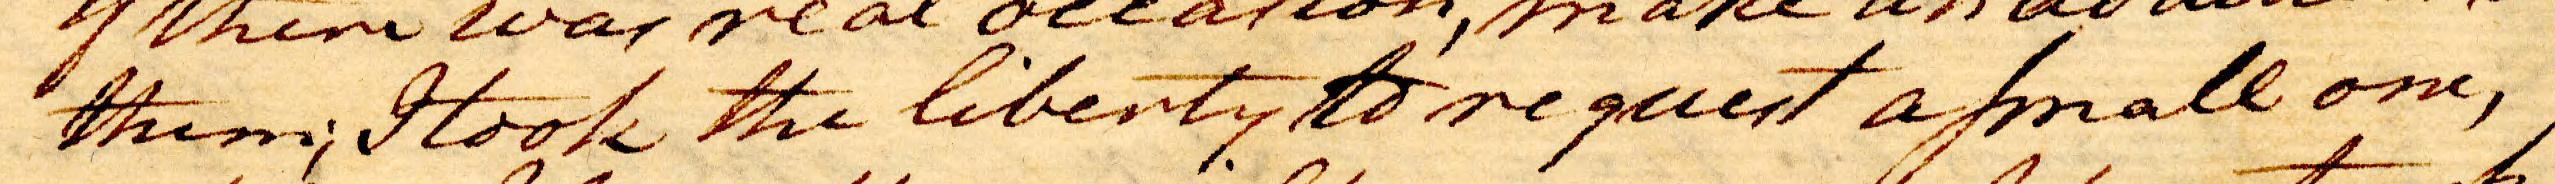them; I took the liberty to request a small one,
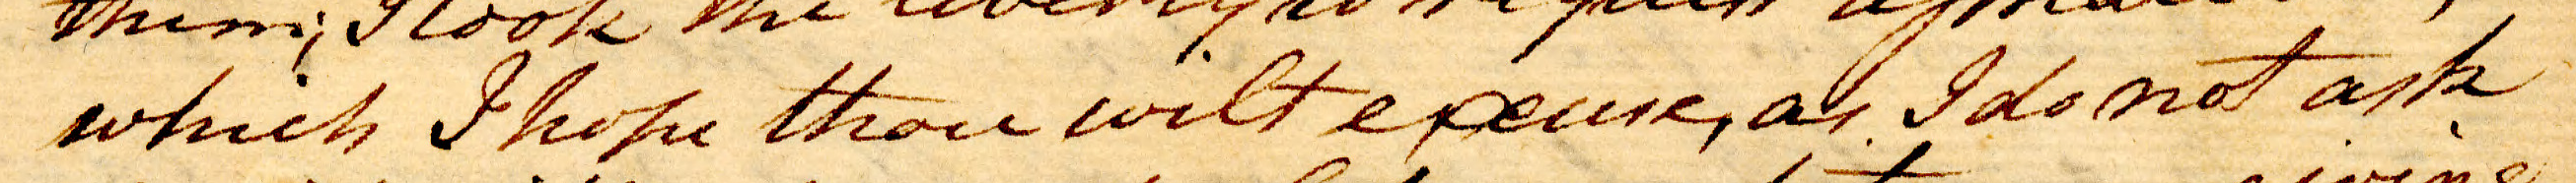which I hope thou wilt excuse, as I do not ask
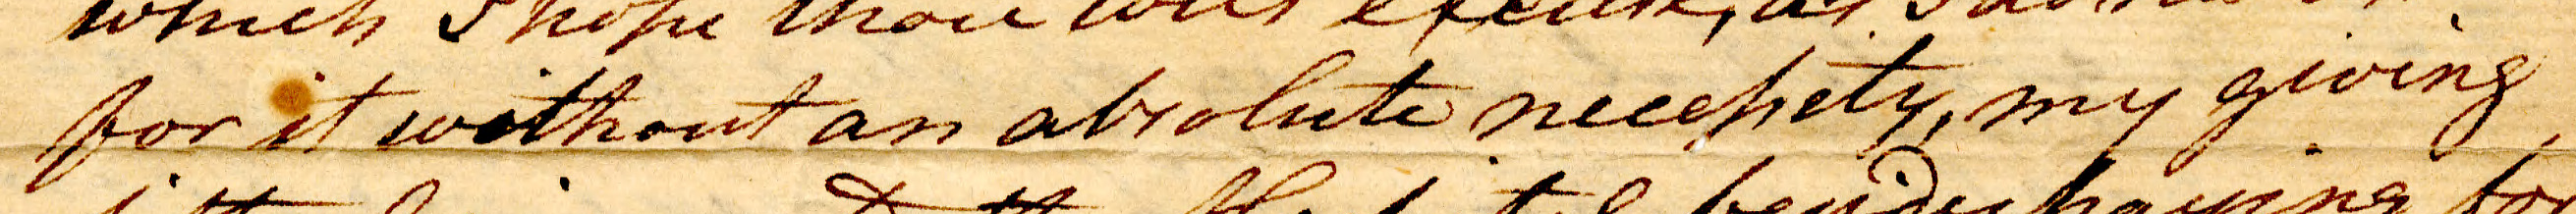for it without an absolute necessity, my giving
